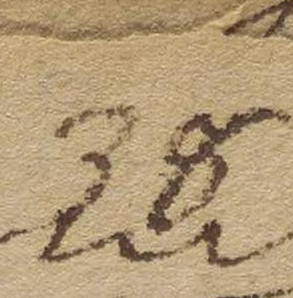38
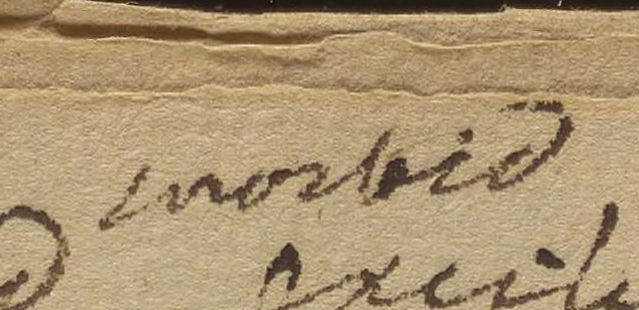morbid
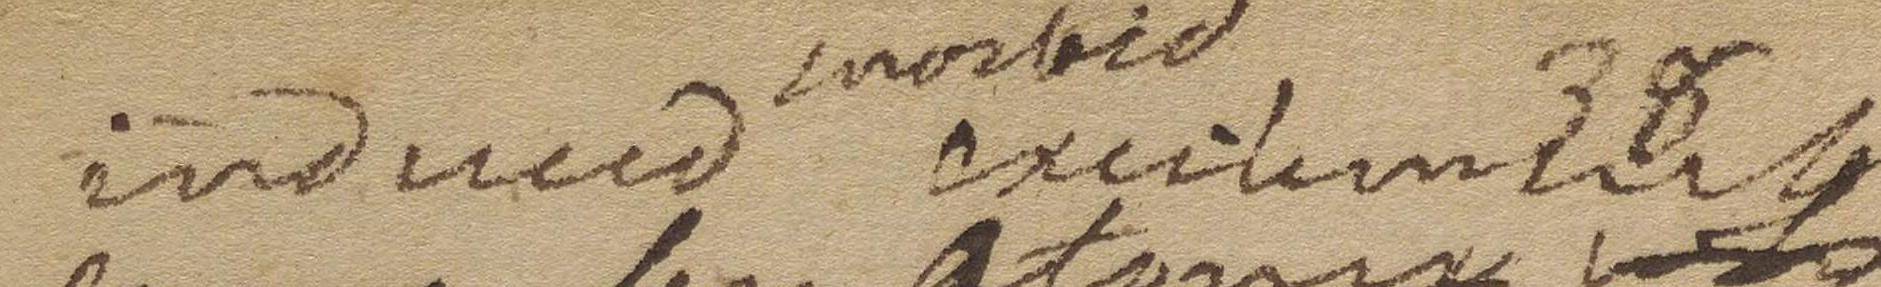induced excitement
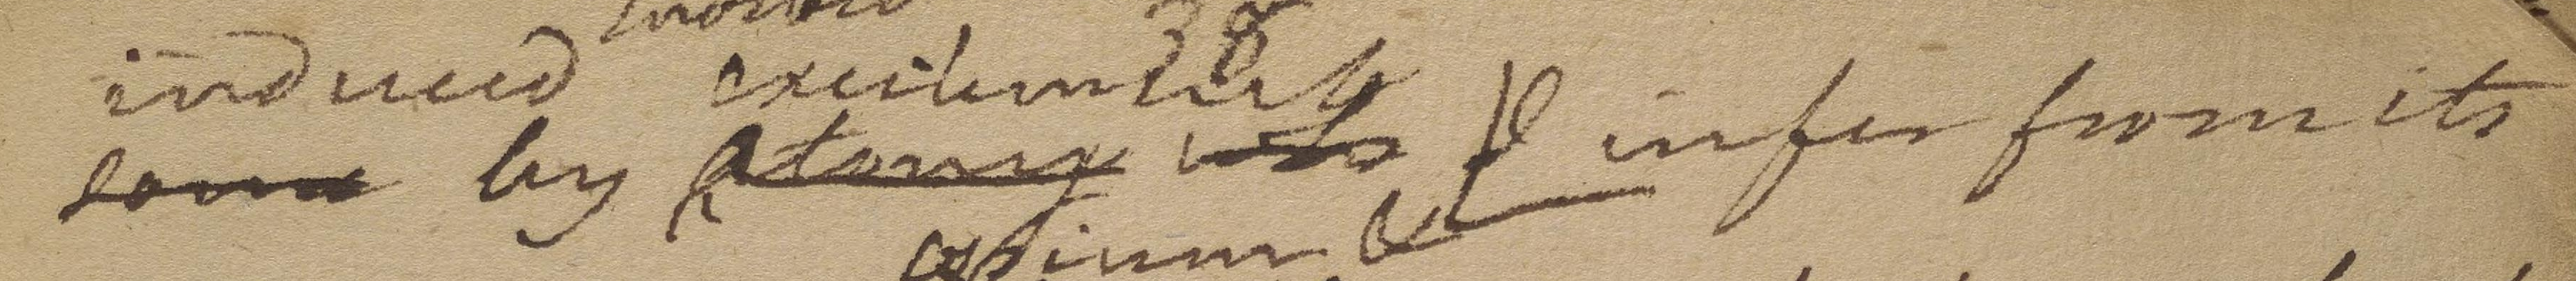[some] by ^ [atony] [was] (I infer from its
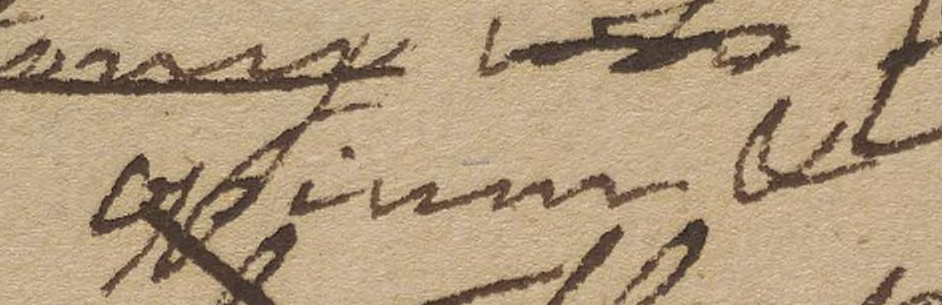opium &
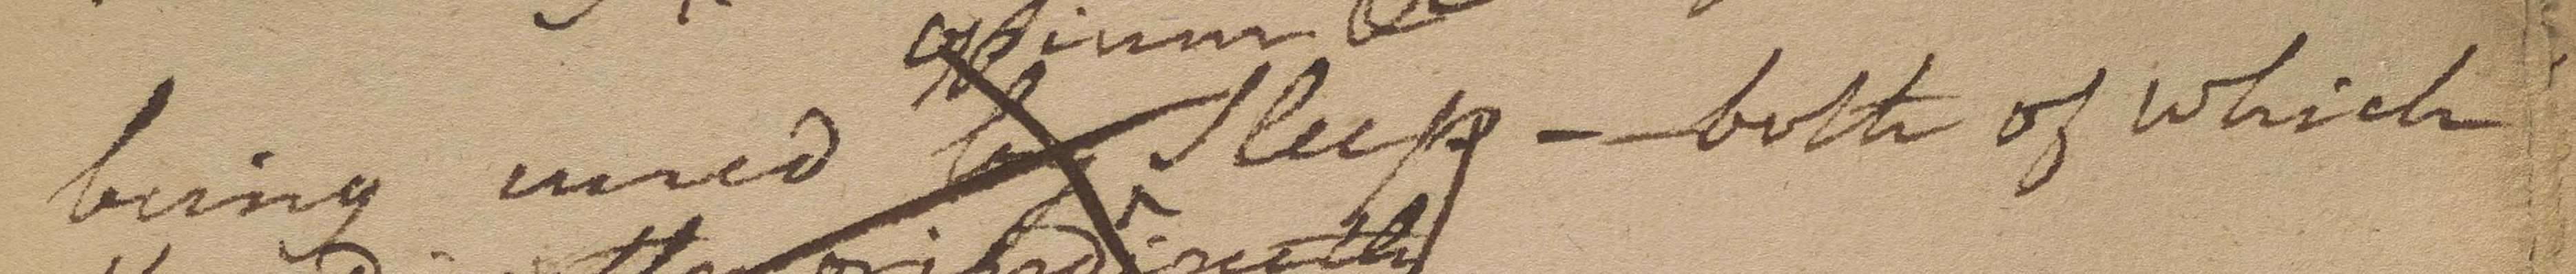being cured by ^ sleep- both of which
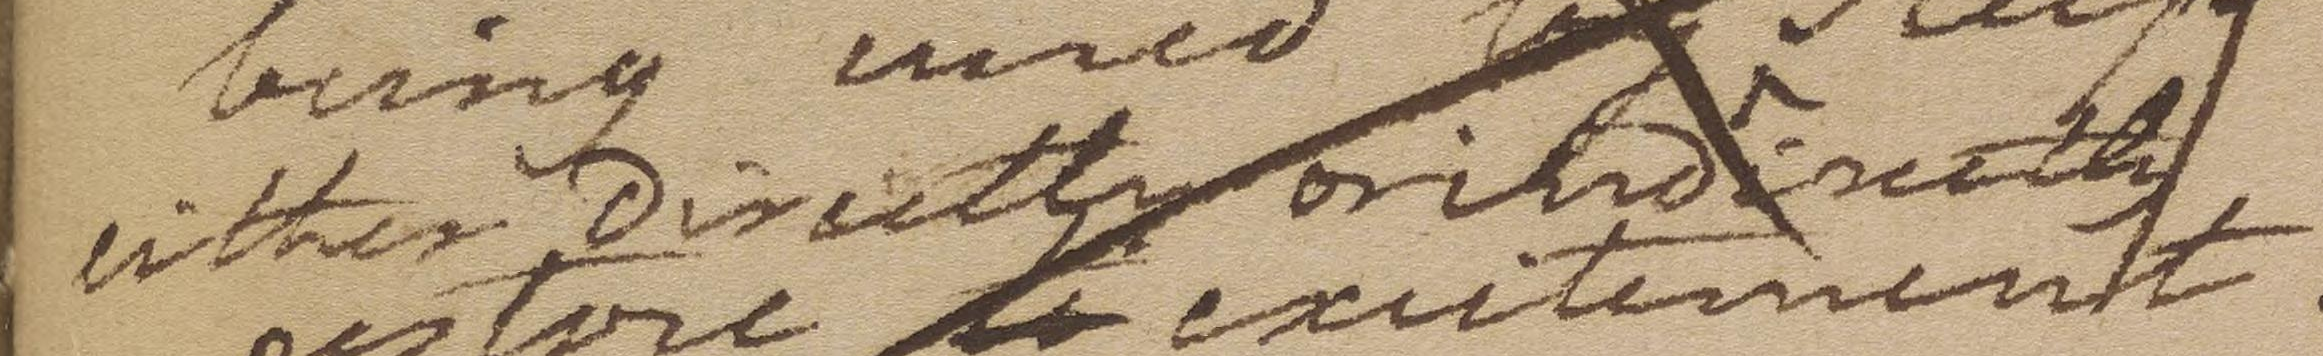either directly or indireclty
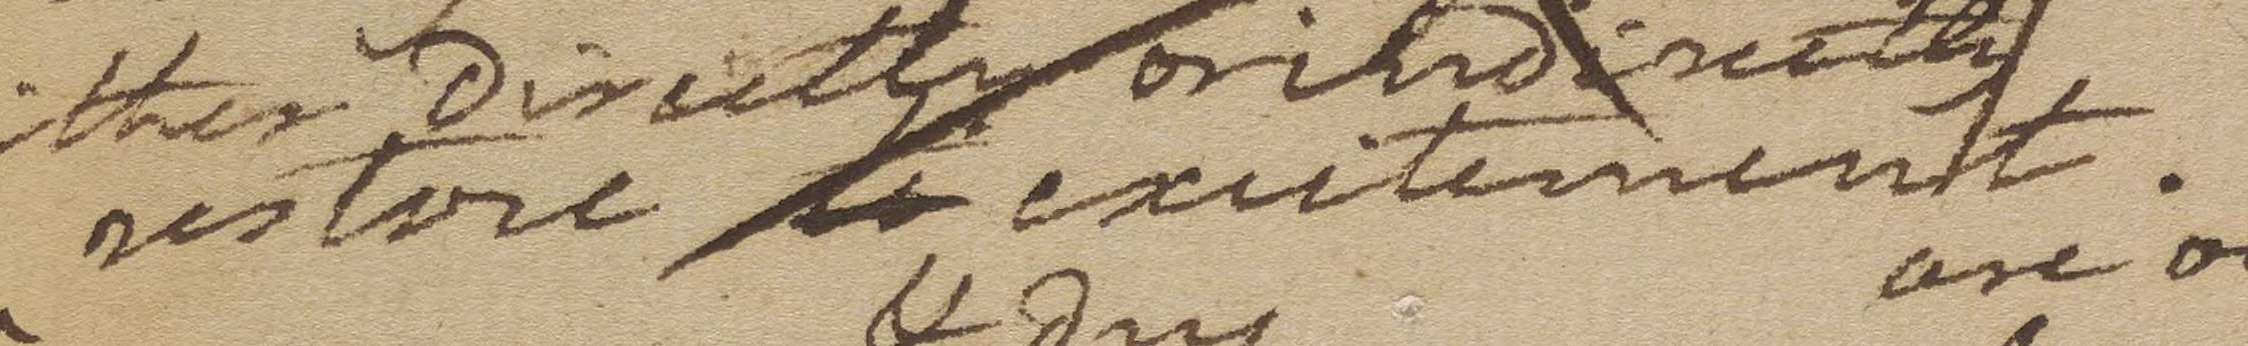restore [to] excitement.
